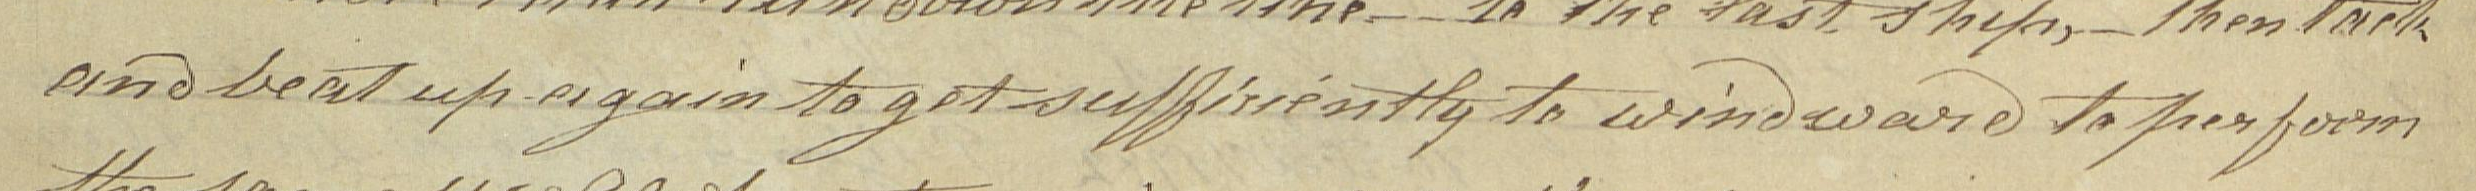and beat up again to get sufficiently to windward to perform
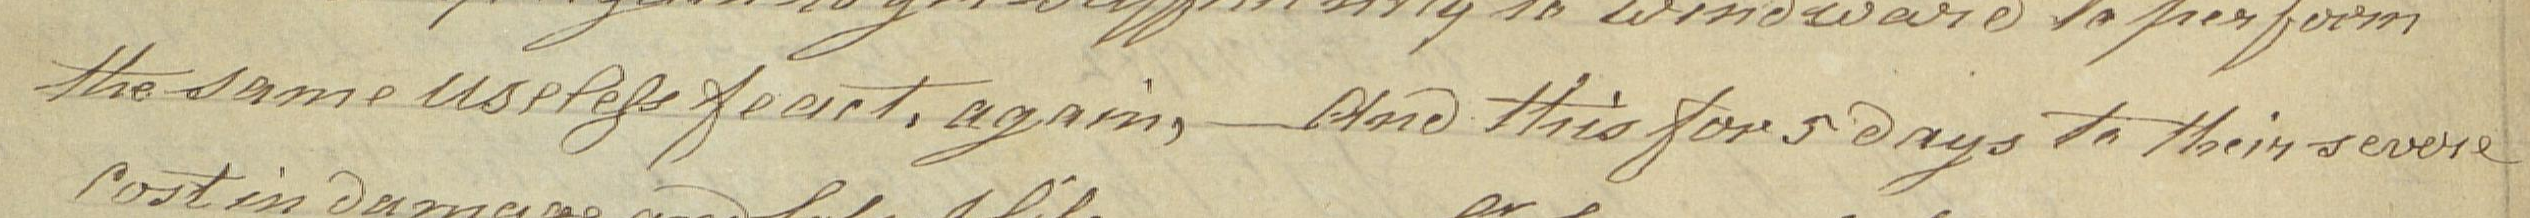the same useless feact, again, and this for 5 days to their severe
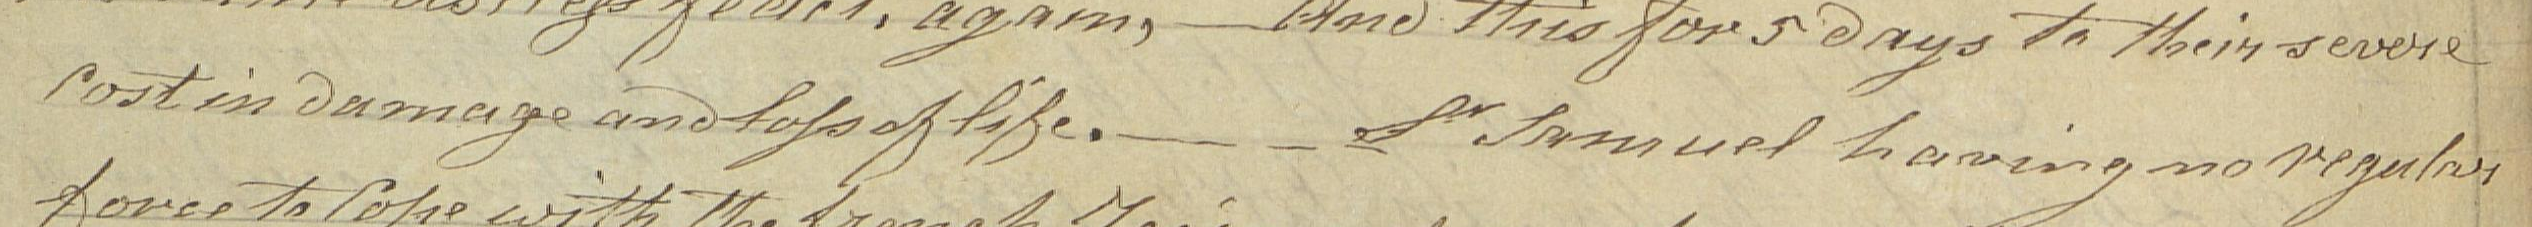cost in damage and loss of life. S^r Samuel having no regular
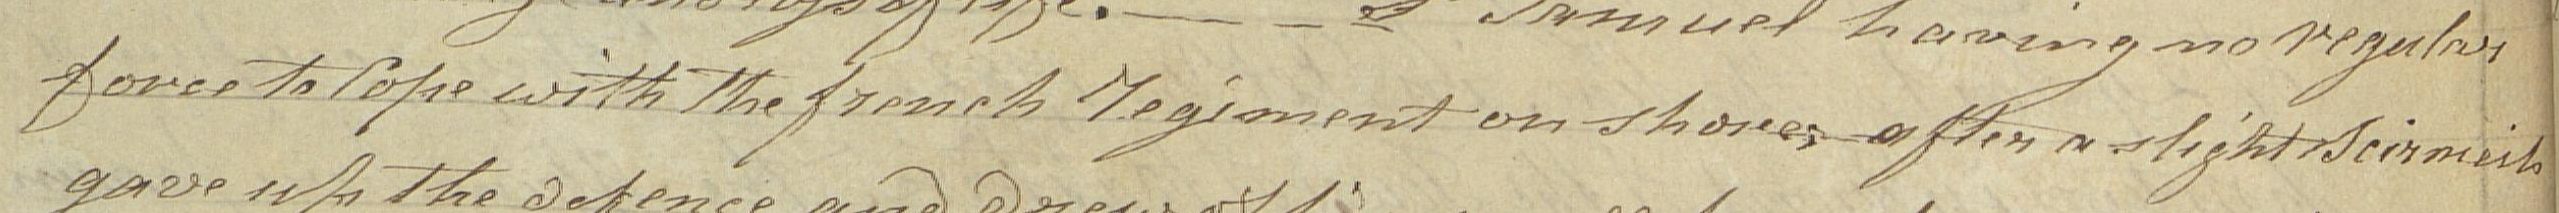force to cope with the French regiment on shore; after a slight scirmish
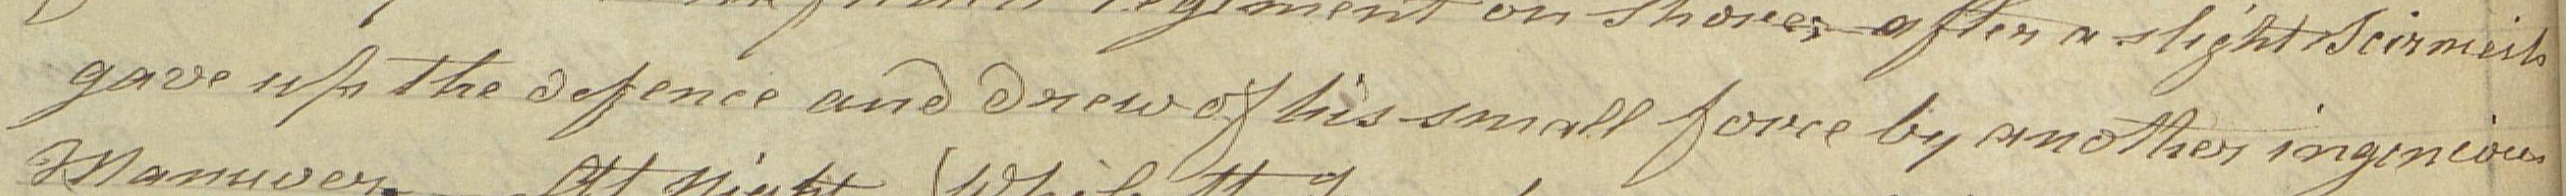gave up the defence and drew of his small force by another igenious
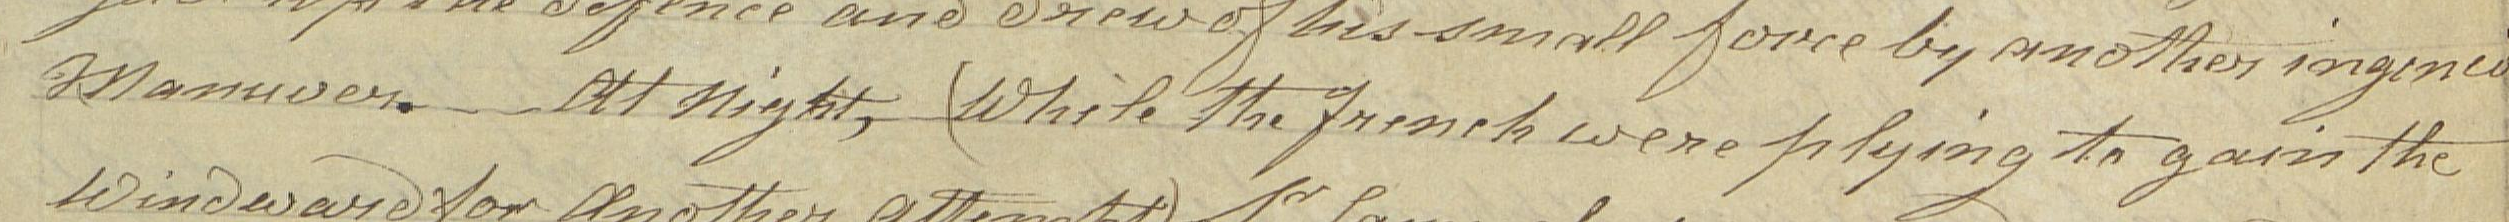Manuver. At Night, (while the French were plying to gain the
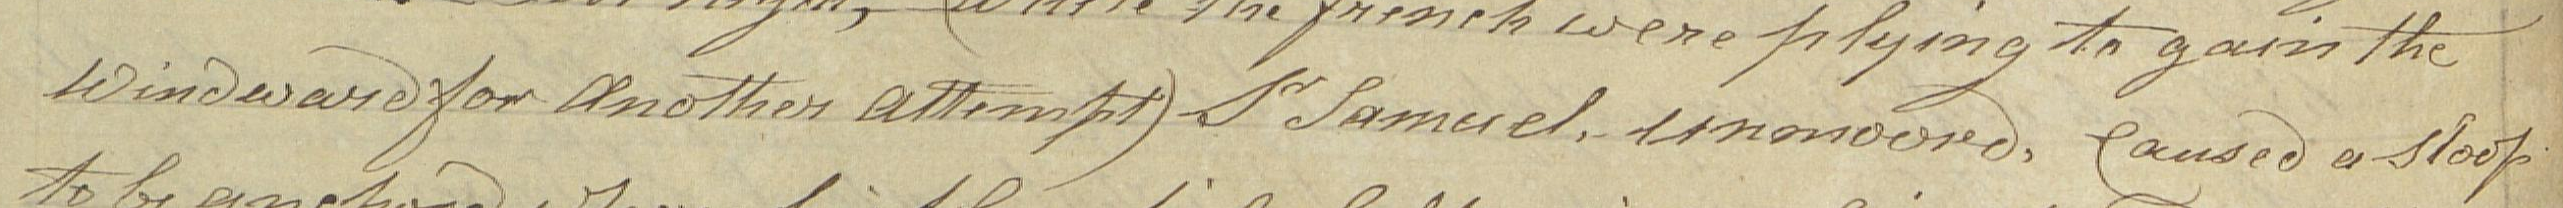Windward for Another Attempt) S^r Samuel unmoord, Caused a Sloop
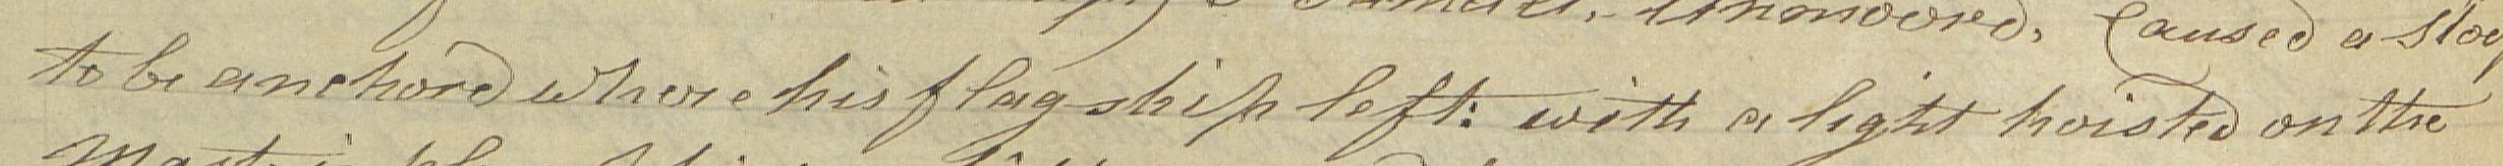to be anchord where his flag ship left: with a light hoisted on the
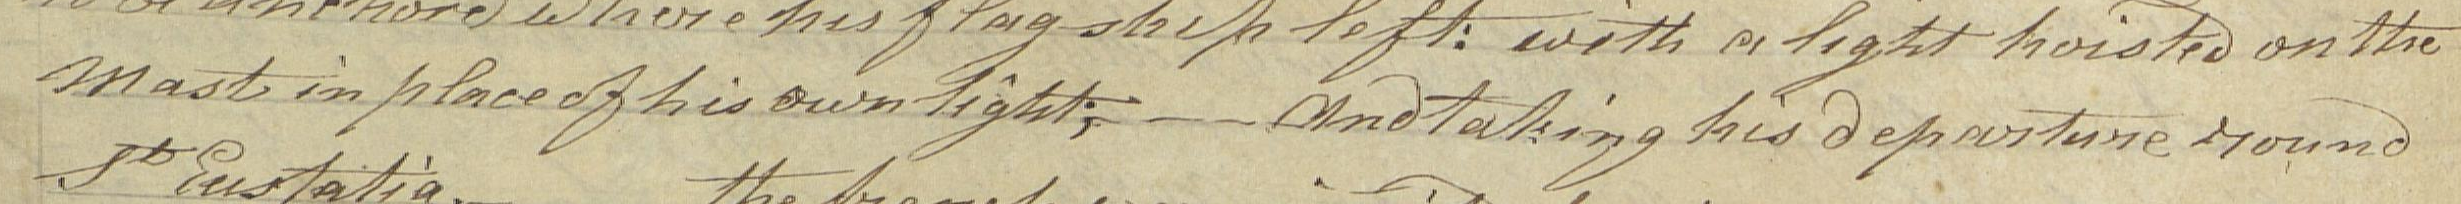mast in place of his own light; And taking his departure round
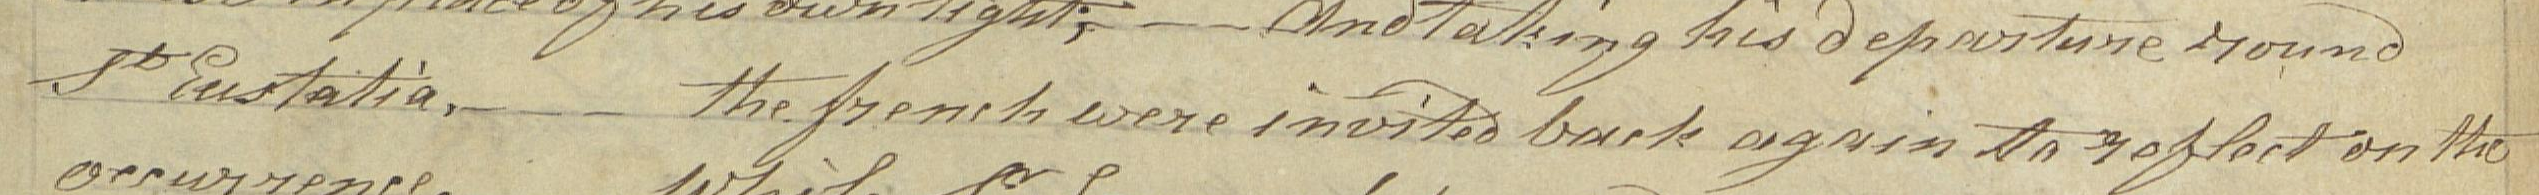S^t Eustatia, the french were invited again to reflect on the
